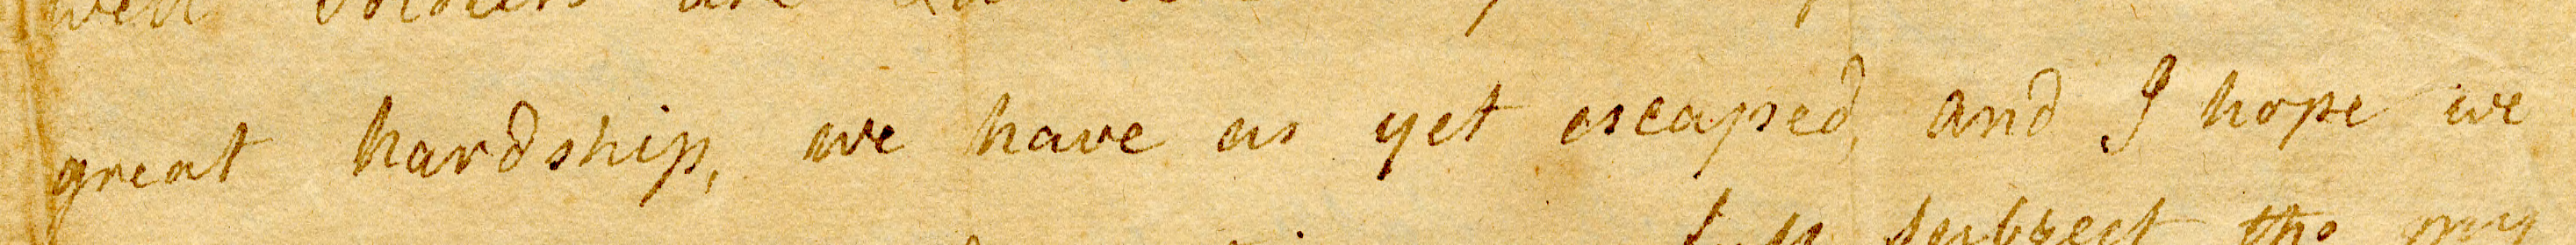great hardship, we have as yet escaped and I hope we
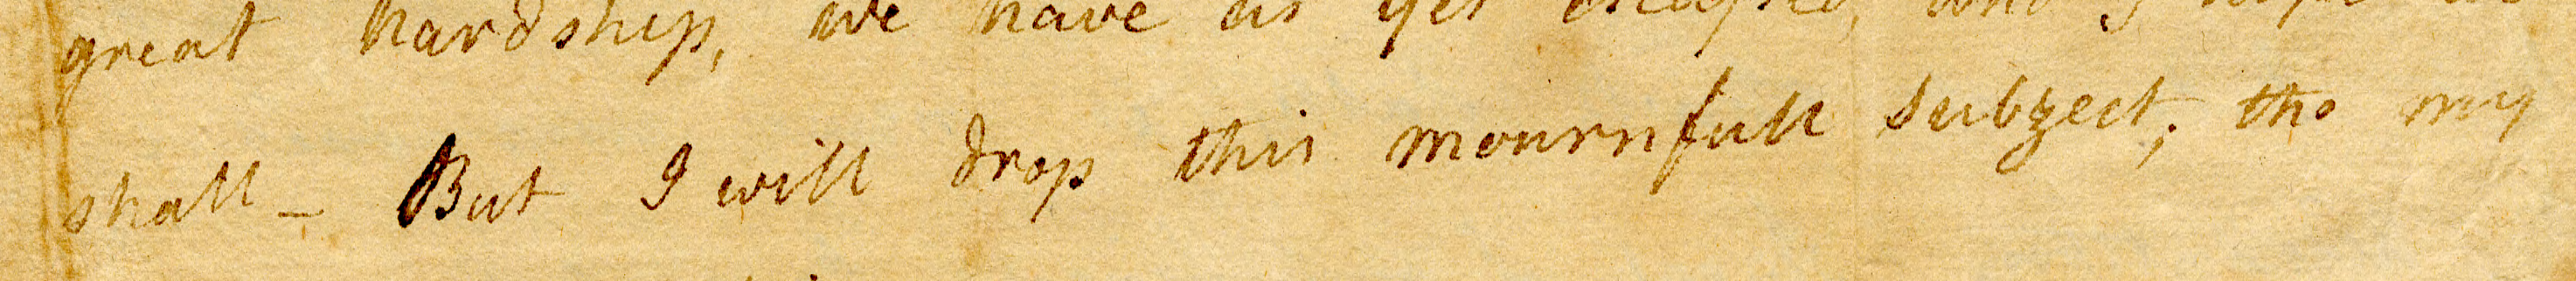shall- But I will drop this mournful subject, tho my
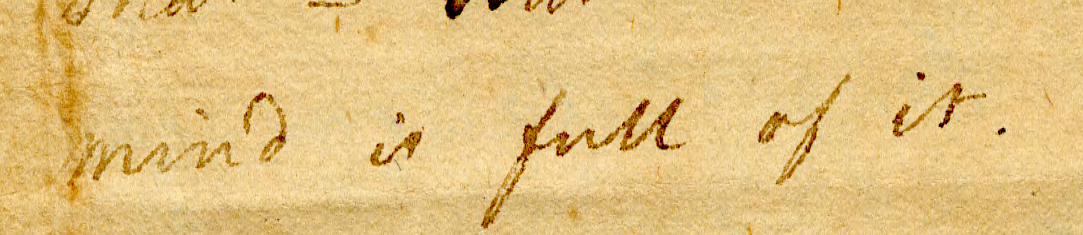mind is full of it.
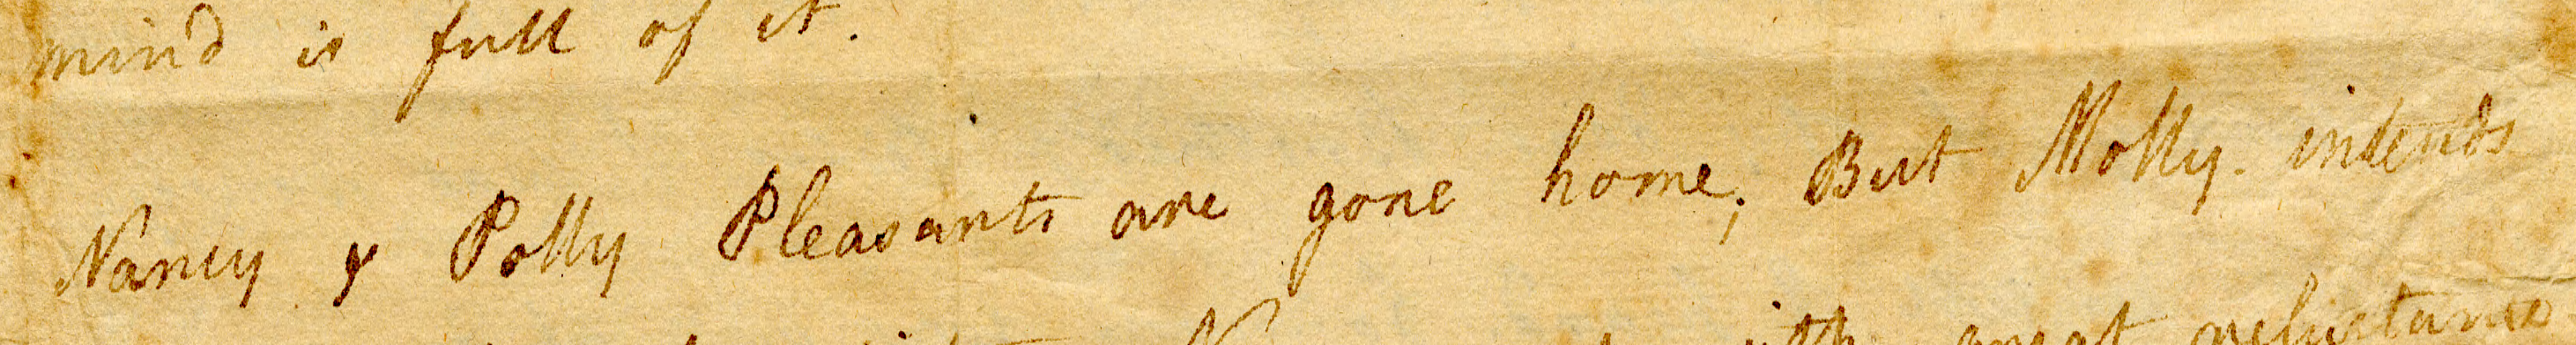Nancy & Polly Pleasants are gone home. But Molly intends
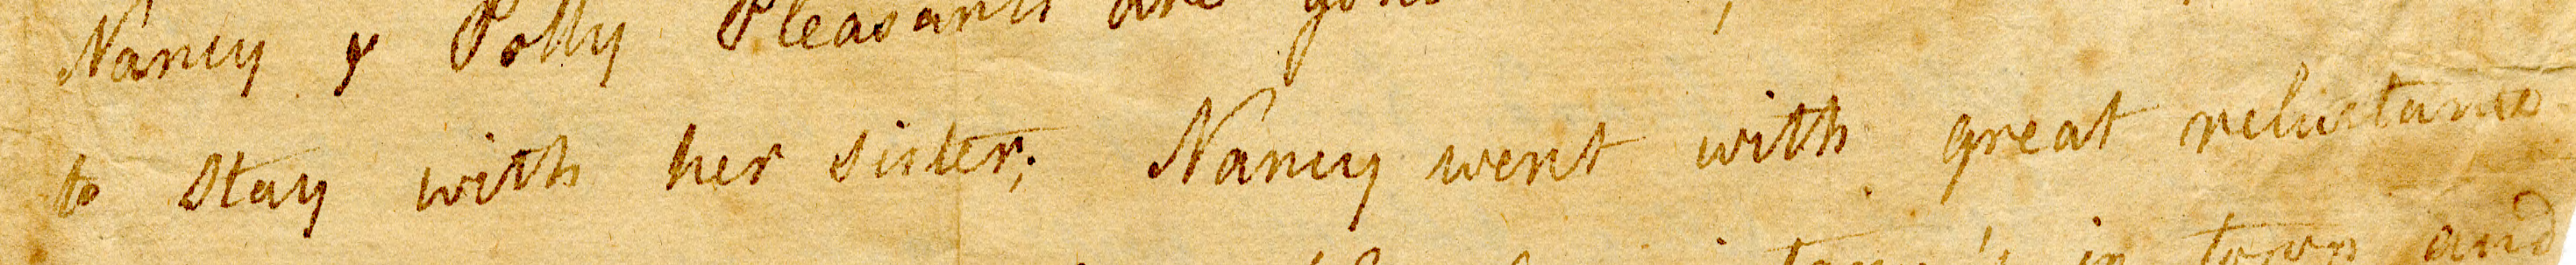to stay with her sister; Nancy went with great reluctance
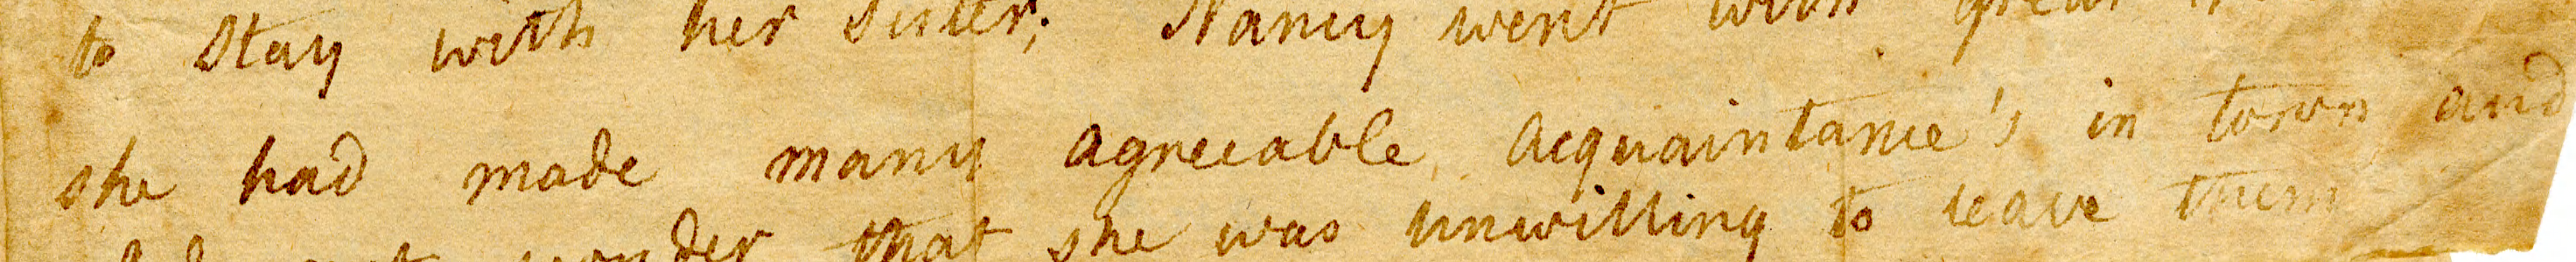she had made many agreeable acquaintance's in town and
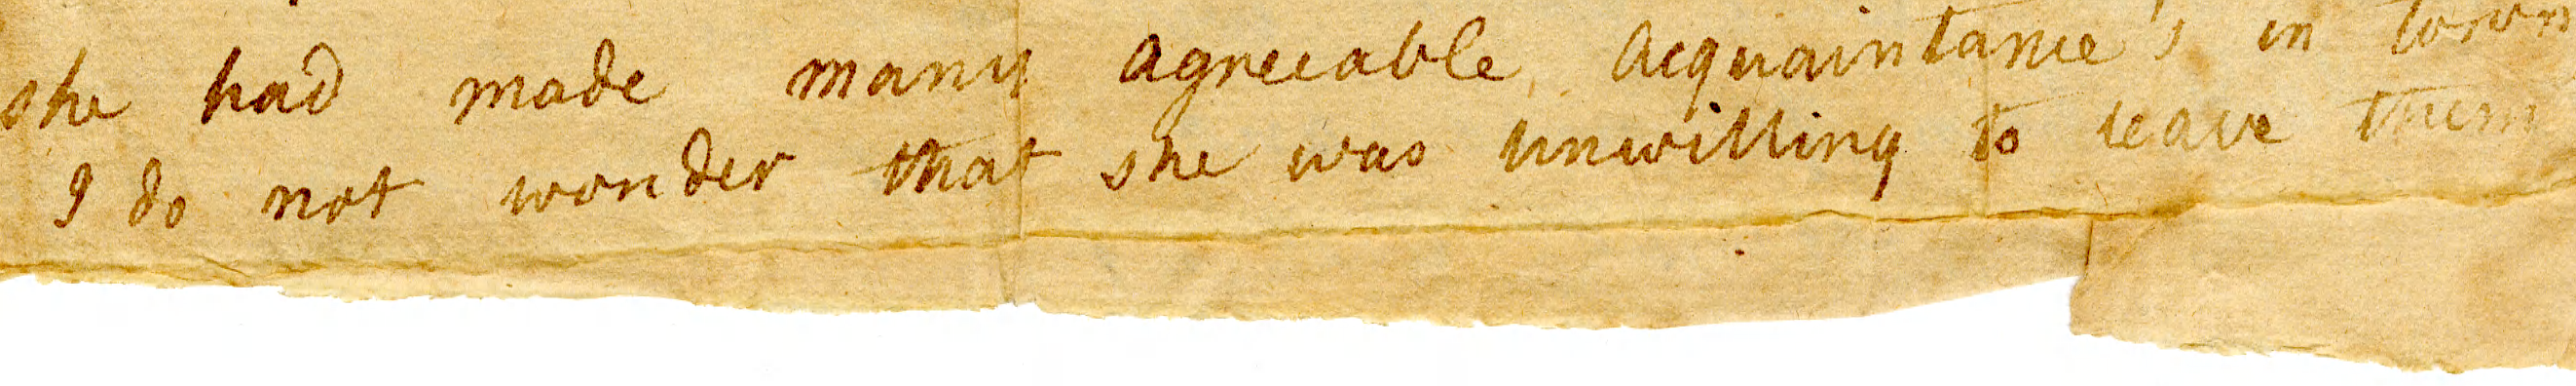I do not wonder that she was unwilling to leave them
